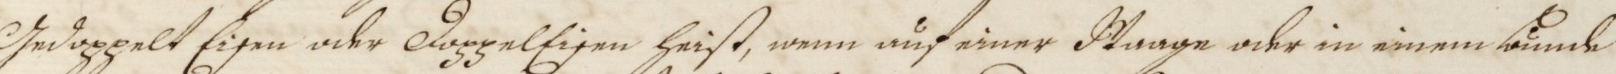Gedoppelt Eisen oder DoppelEisen heist, wenn auf einer Waage oder in einem Bunde
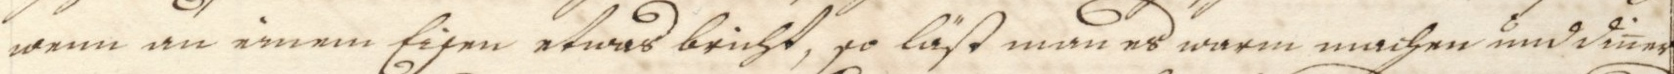wenn an einem Eisen etwas bricht, so läst man es warm machen und dinner
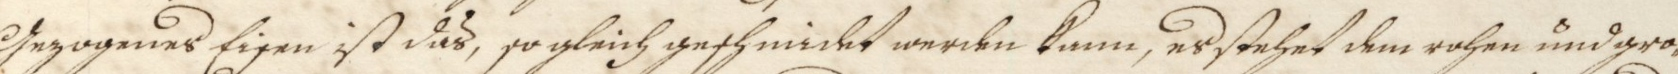Gezogenes Eisen ist das, so gleich geschmidet werden kann, es stehet dem rohen und gro-
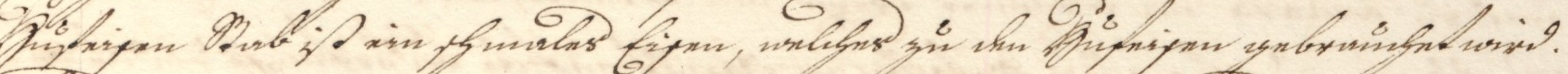Hufeisen Stab ist ein schmales Eisen, welches zu den Hufeisen gebrauchet wird.
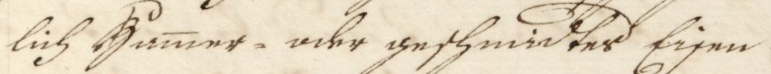lich Hammer- oder geschmidtes Eisen.
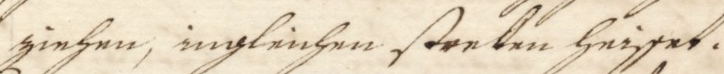ziehen, ingleichen streken heisset.
